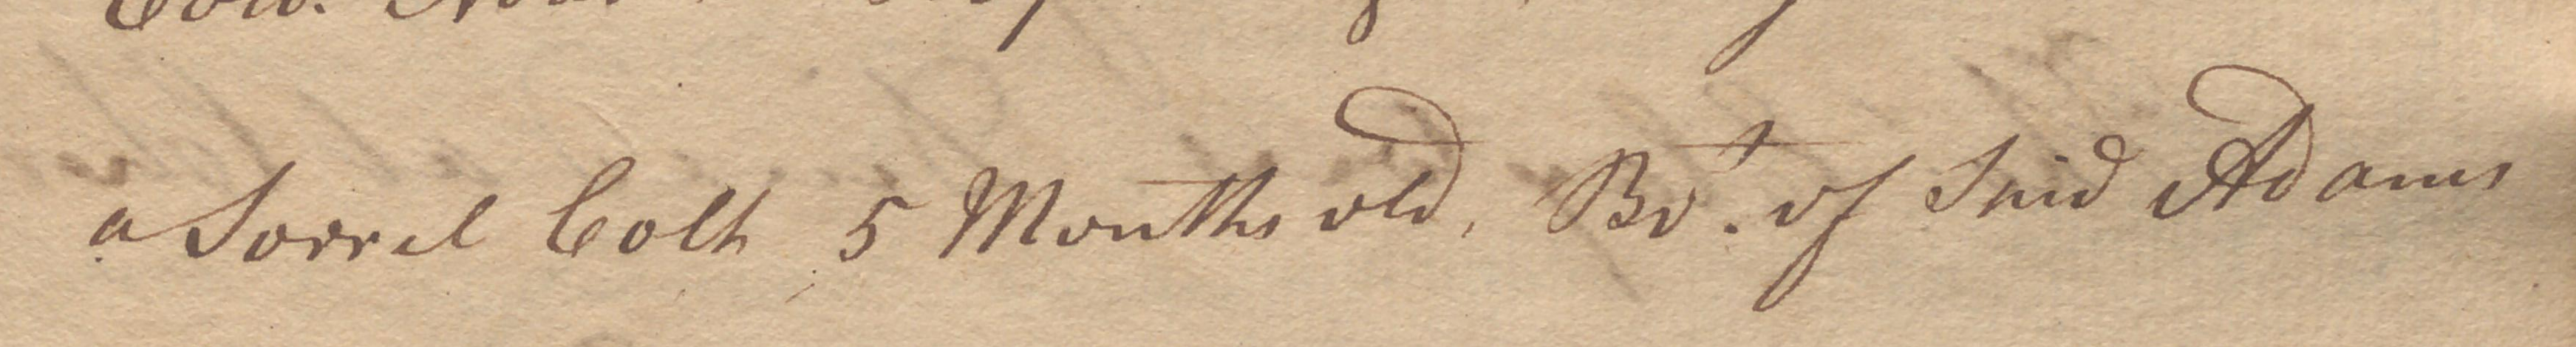a Sorrel Colt 5 Months old, Br^t. of said Adams
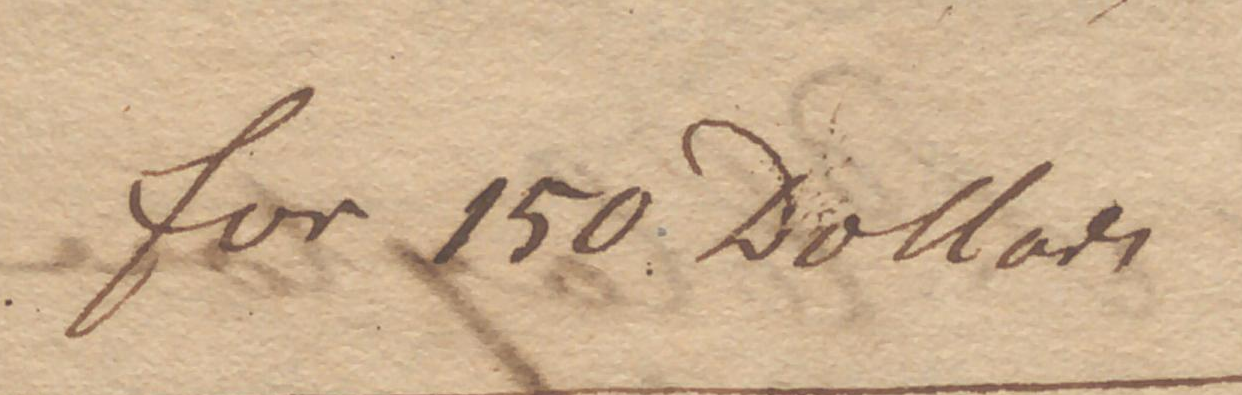for 150 Dollars
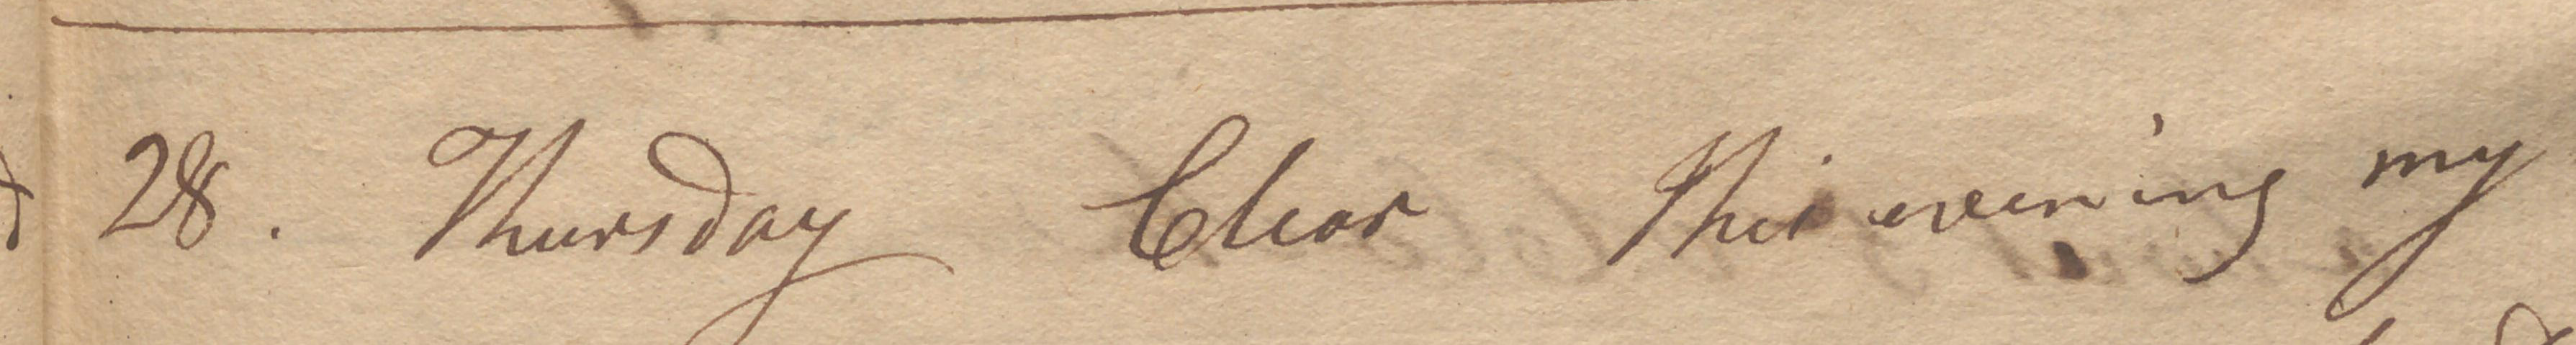28. Thursday Clear This evening my
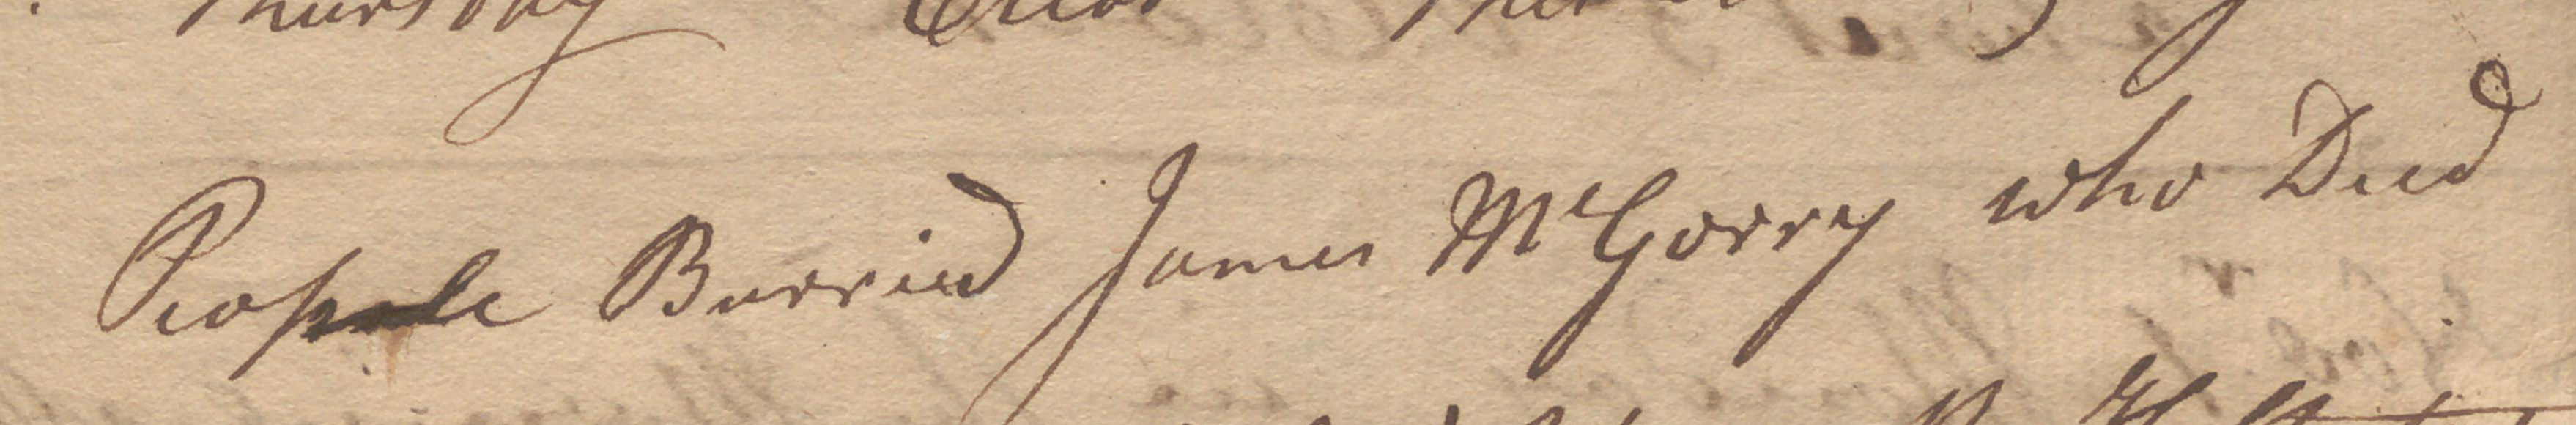People Burried James M^cGorry who Died
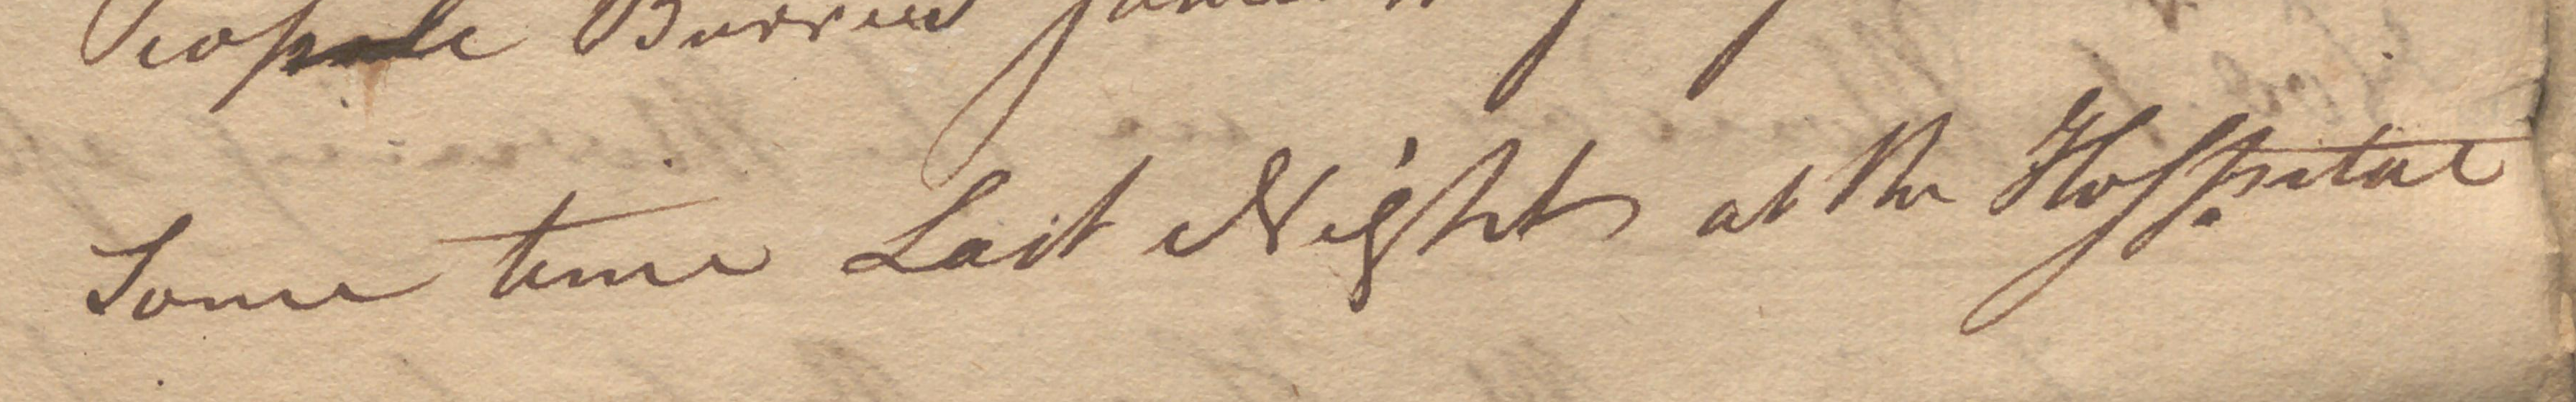some time Last Night at the Hostpital
